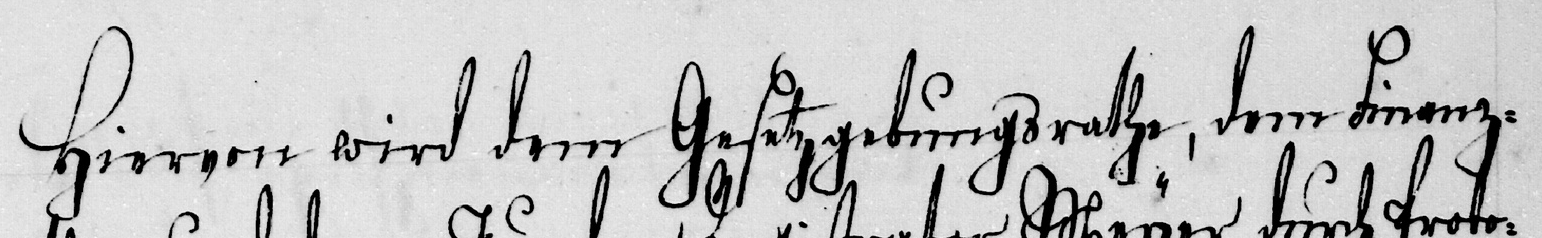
Hiervon wird dem Gesetzgebungsrathe, dem Finanz¬
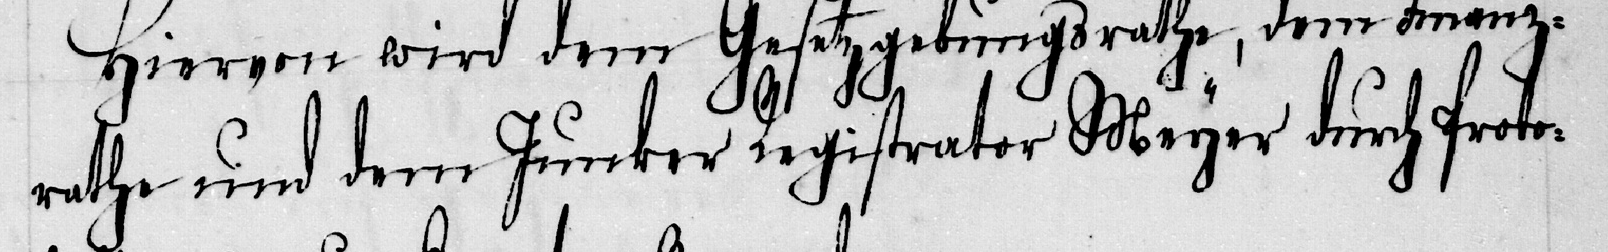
rathe und dem Junker Registrator Meyer durch Proto¬
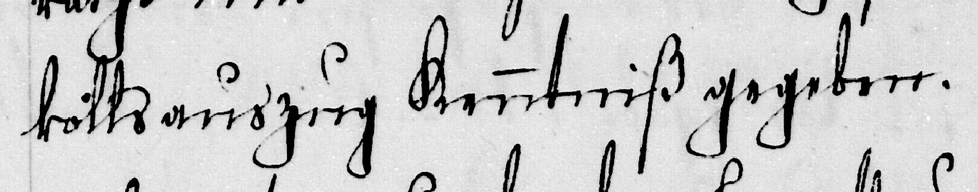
kollsauszug Kenntniß gegeben.
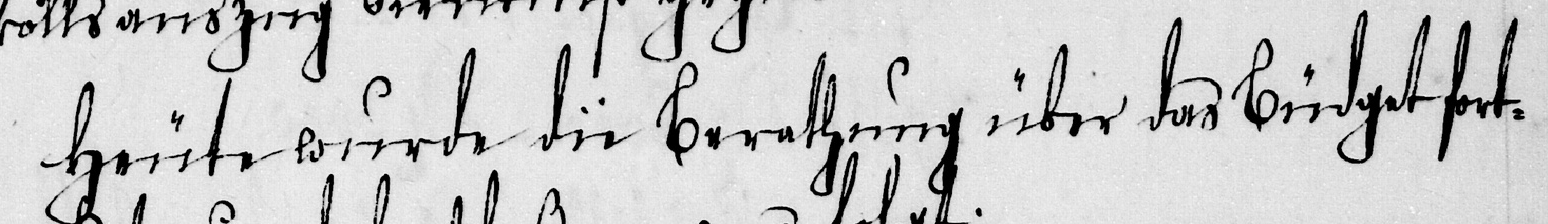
Heute wurde die Berathung über das Büdget for¬
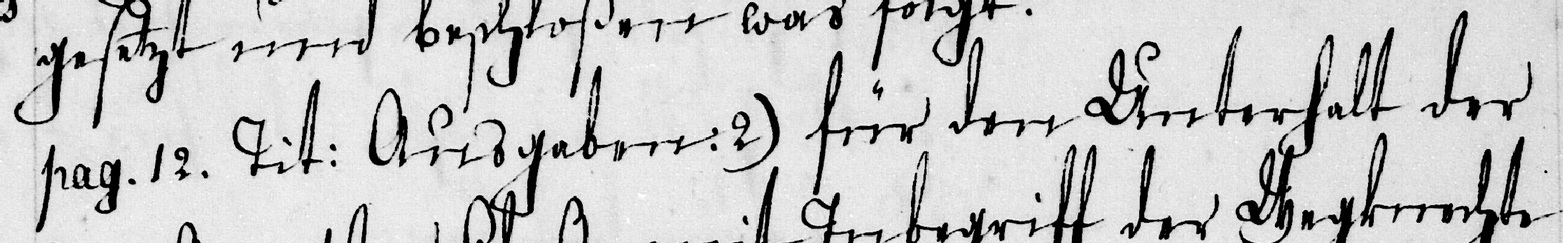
pag. 12. Tit: Ausgaben: 2) für den Unterhalt der
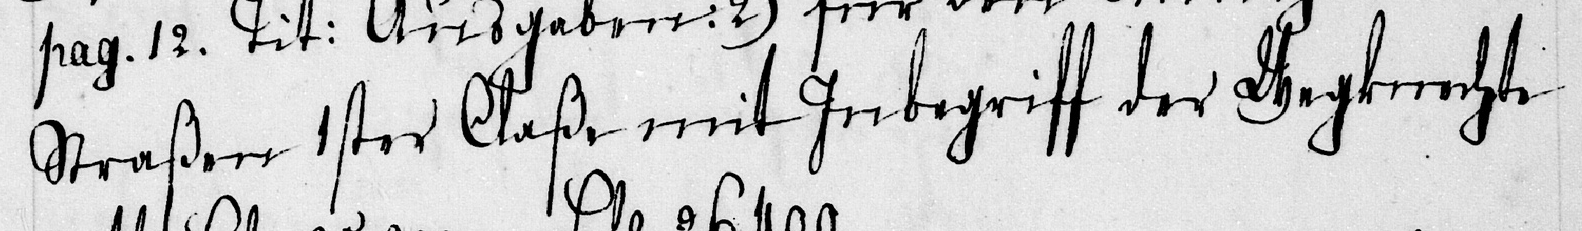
Straßen 1ster Claße mit Inbegriff der Wegknechte
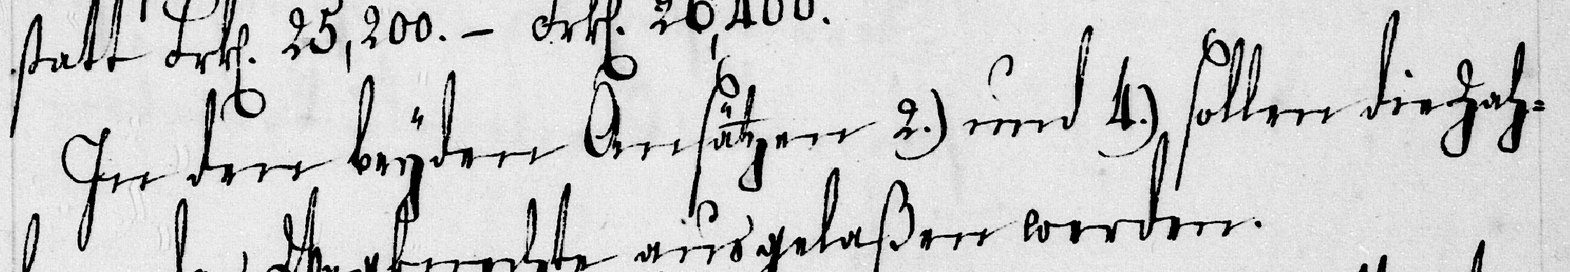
In den beyden Ansätzen 2.) und 4.) sollen die
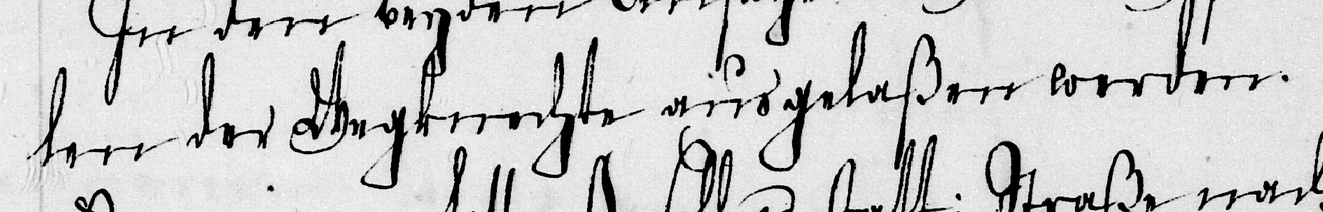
len der Wegknechte ausgelaßen werden.
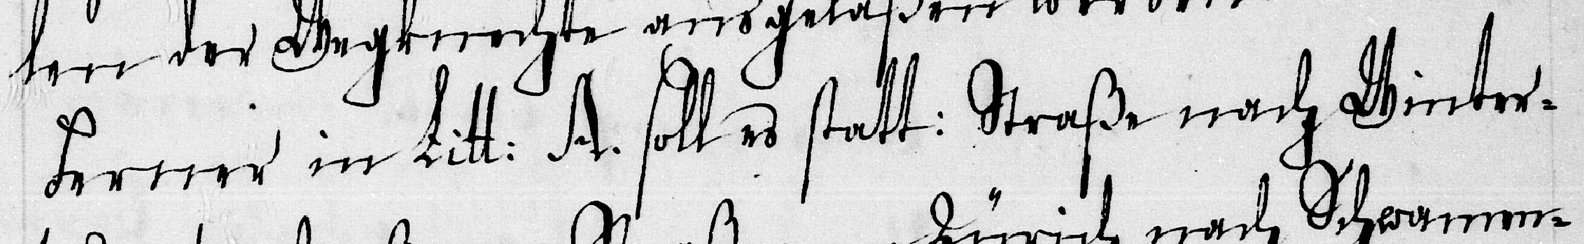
Ferner in Litt: A. soll es statt: Straße nach Winter¬
